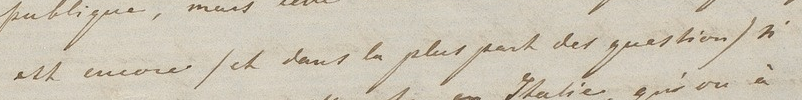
est encore (et dans la plus part des question) si
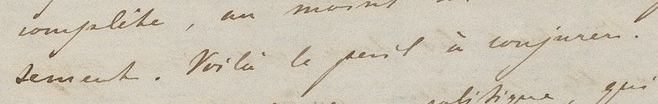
sement. Voilà le peril à conjurer.
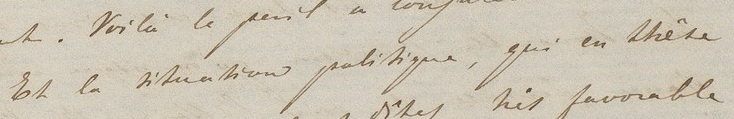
Et la situation politique, qui en thêse
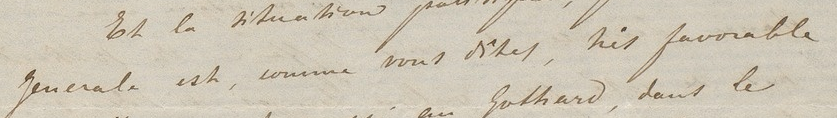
Generale est, comme vous dîtes, très favorable
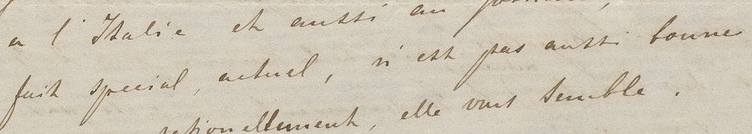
fait special, actuel, n'est pas aussi bonne
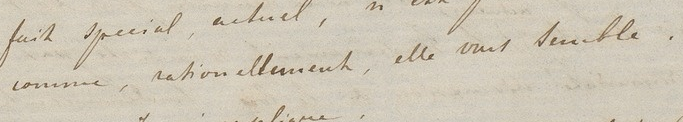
comme, rationellement, elle vous semble.
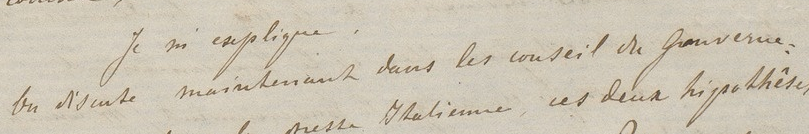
On discute maintenant dans les conseil du Gouverne-
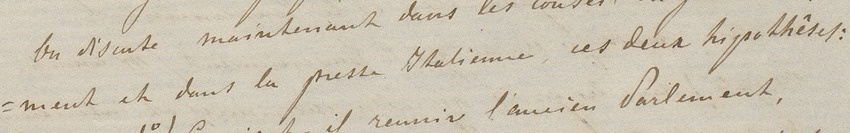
ment et dans la presse Italienne, ces deux hipothêses:
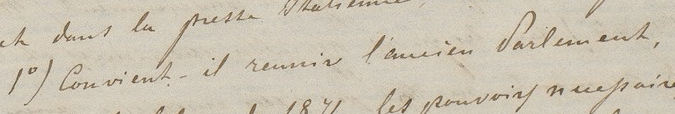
1o ) Convient-il reunir l'ancien Parlement,
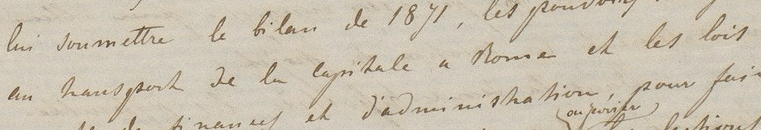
au transport de la capitale a Rome et les lois
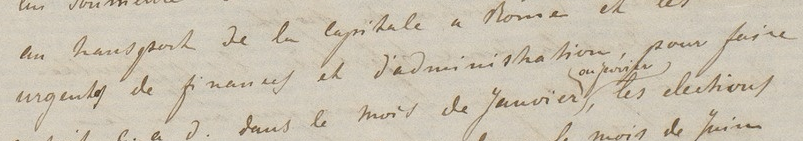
urgentes de finances et d'administration, pour faire
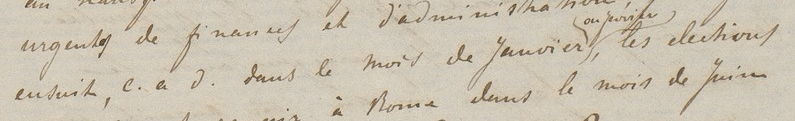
ensuit, c. a. d. dans le mois de Janvier ou Fevrier, les elections
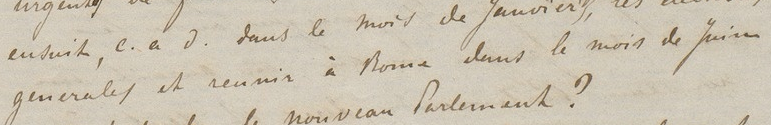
generales et reunir à Rome dans le mois de Juin
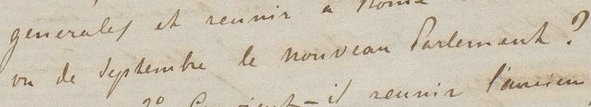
ou de Septembre le nouveau Parlement?
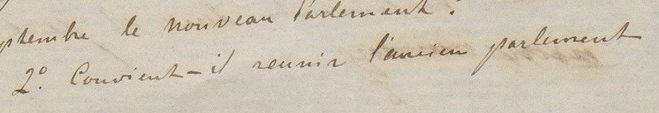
2o Convient-il reunir l'ancien parlement
